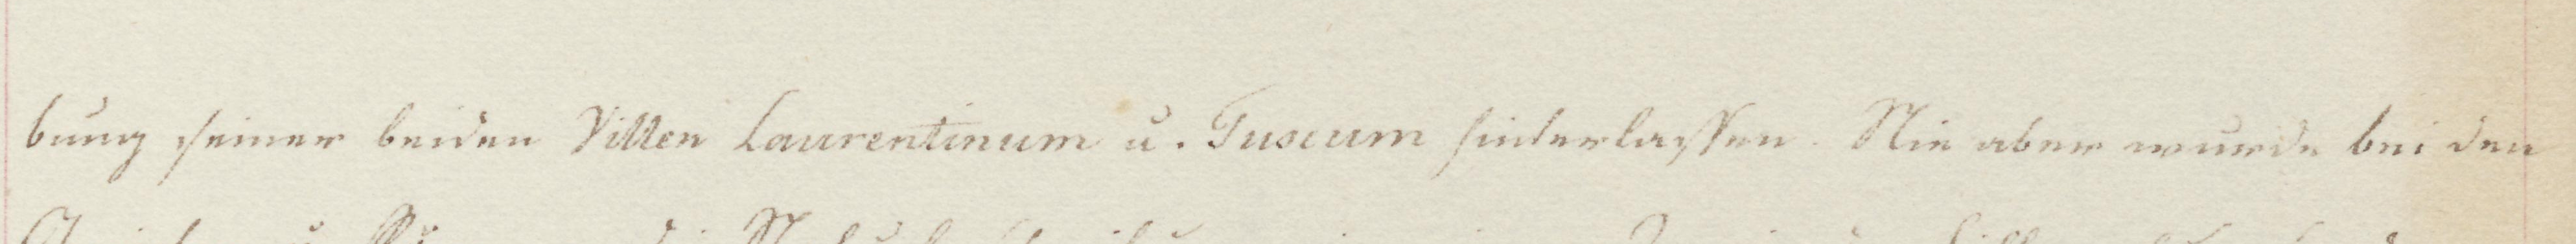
bung seiner beiden Villen Laurentinum u. Tuscum hinterlassen. Nie aber wurde bei den
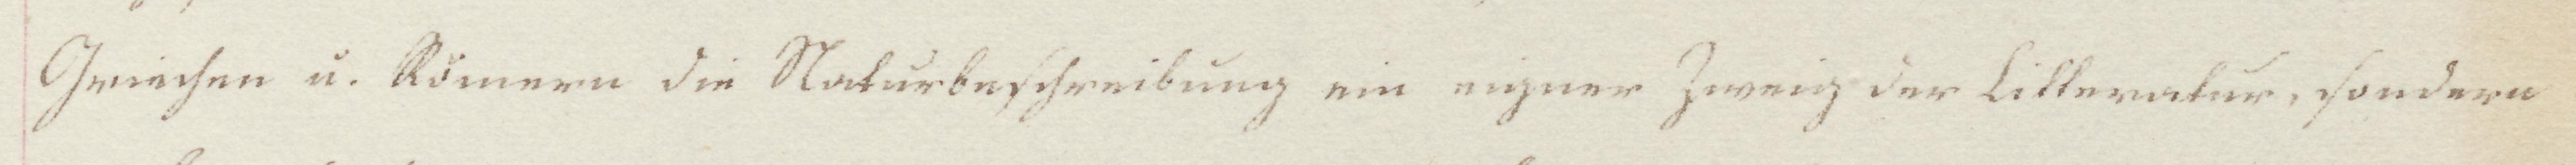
Griechen u. Römern die Naturbeschreibung ein eigner Zweig der Litteratur, sondern
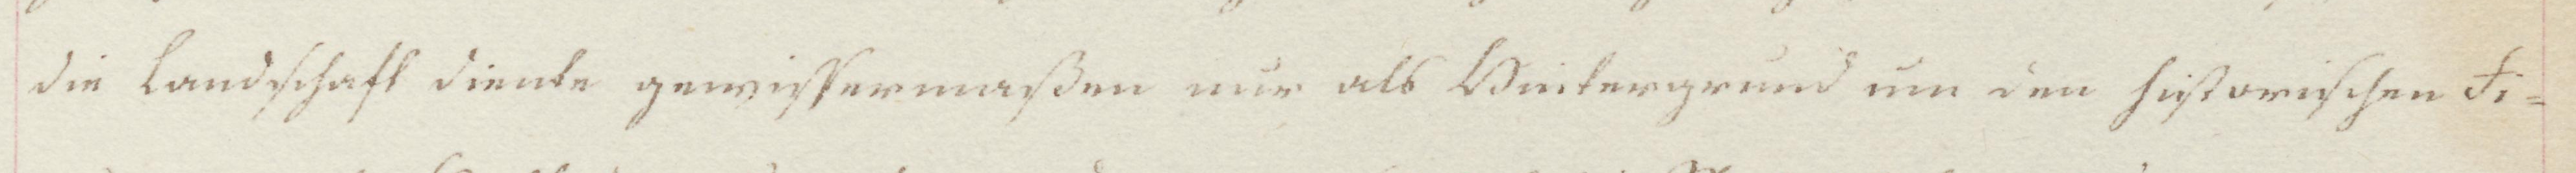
die Landschaft diente gewissermaßen nur als Hintergrund um den historischen Fi-
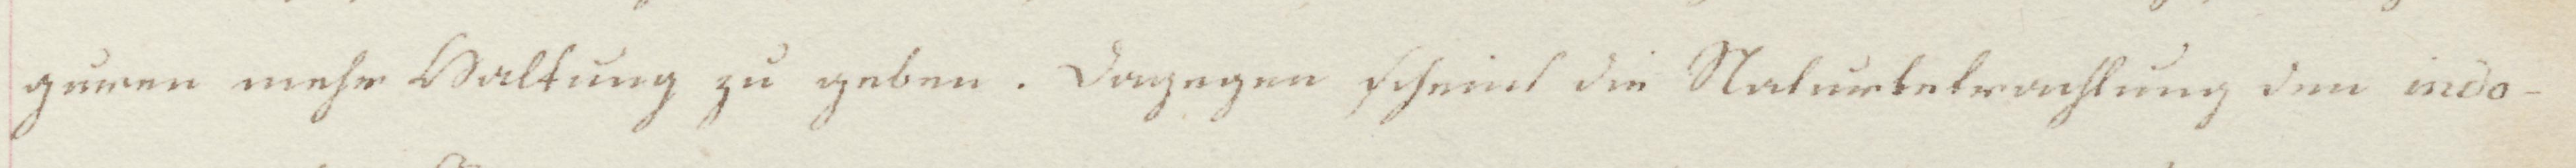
guren mehr Haltung zu geben. Dagegen scheint die Naturbetrachtung den indo-
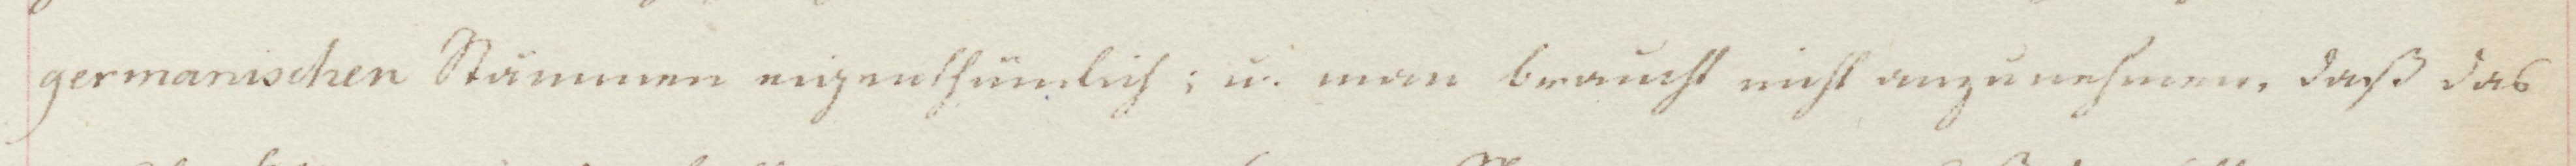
germanischen Stämmen eigenthümlich; u. man braucht nicht anzunehmen, daß das
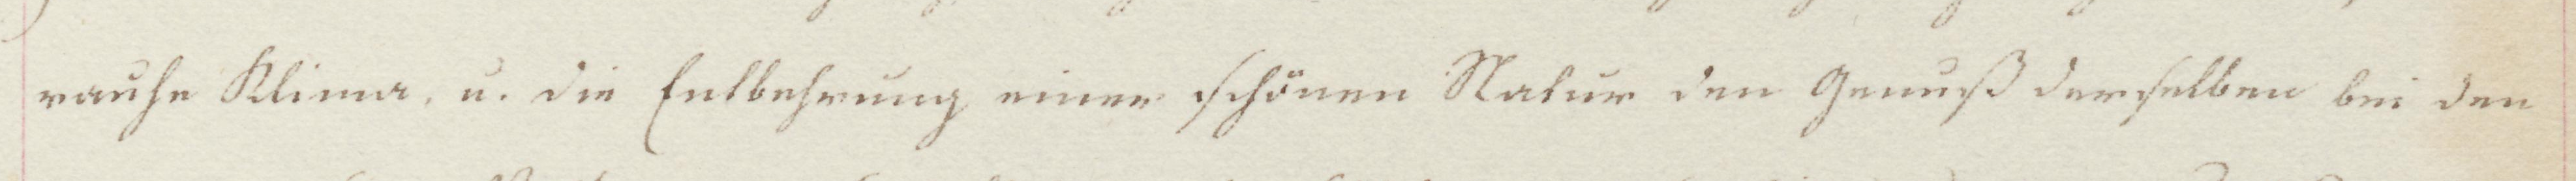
rauhe Klima u. die Entbehrung einer schönen Natur den Genuß derselben bei den
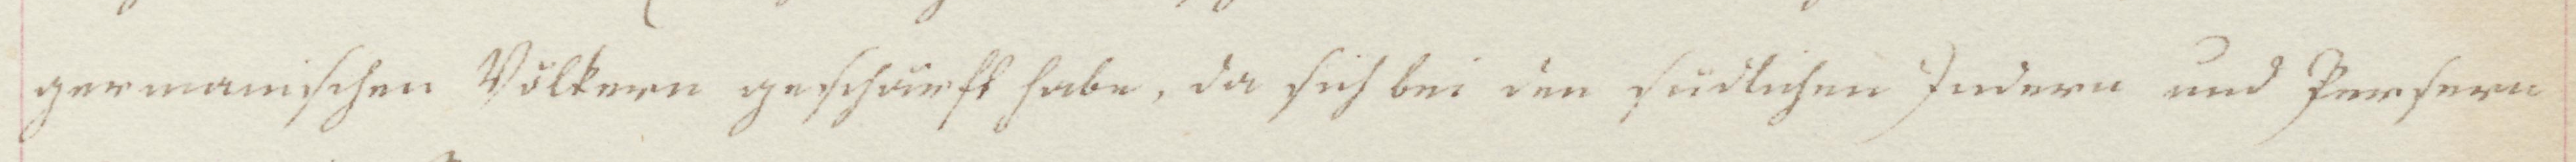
germanischen Völkern geschärft habe, da sich bei den südlichen Indern und Persern
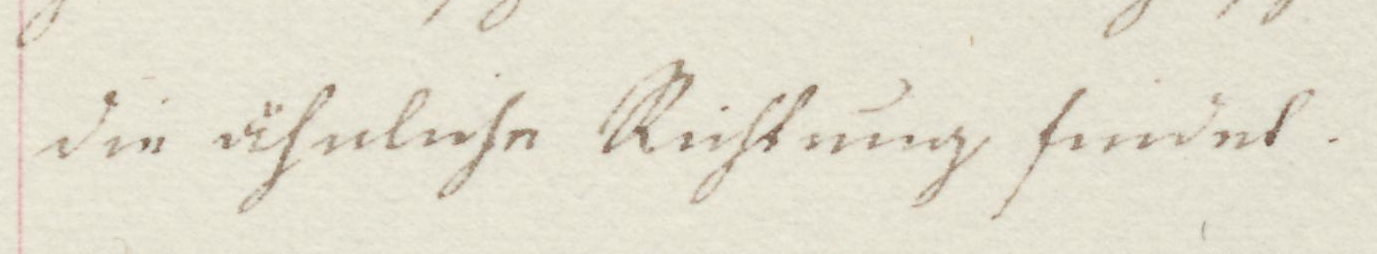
die ähnliche Richtung findet.
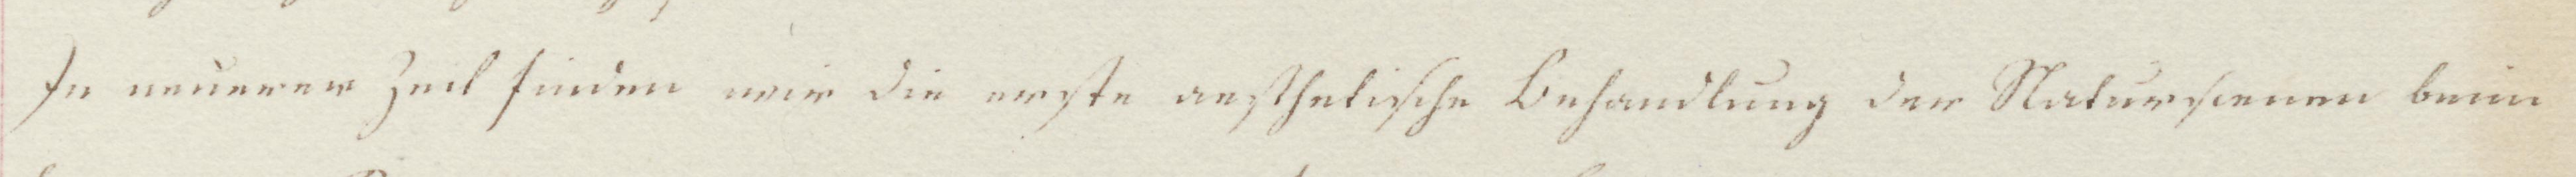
In neuerer Zeit finden wir die erste aesthetische Behandlung der Naturscenen beim
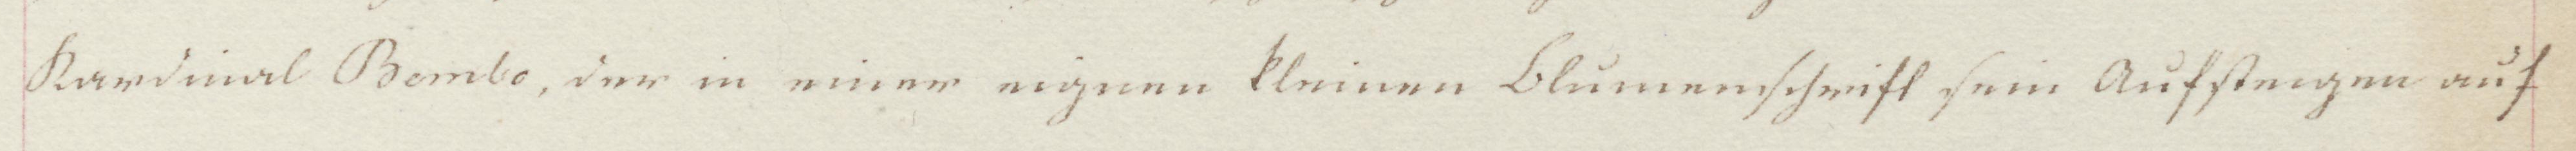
Kardinal Bembo, der in einer eignen kleinen Blumenschrift sein Aufsteigen auf
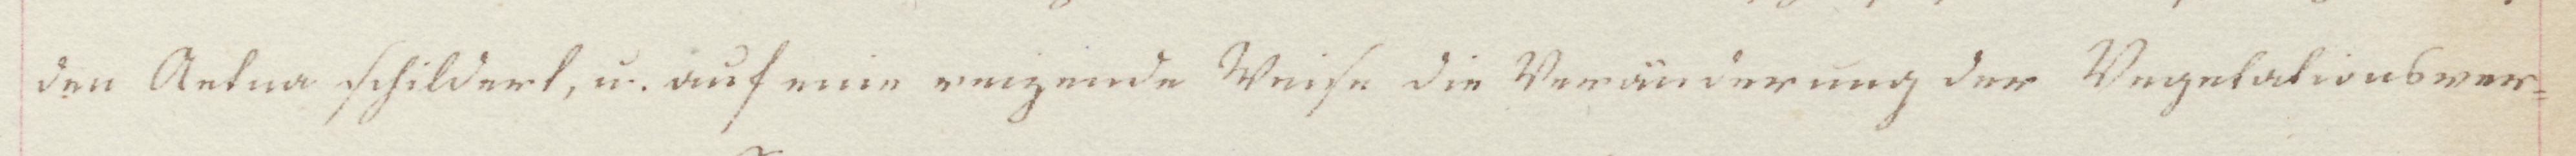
den Aetna schildert, u. auf eine reizende Weise die Veränderung der Vegetationsver-
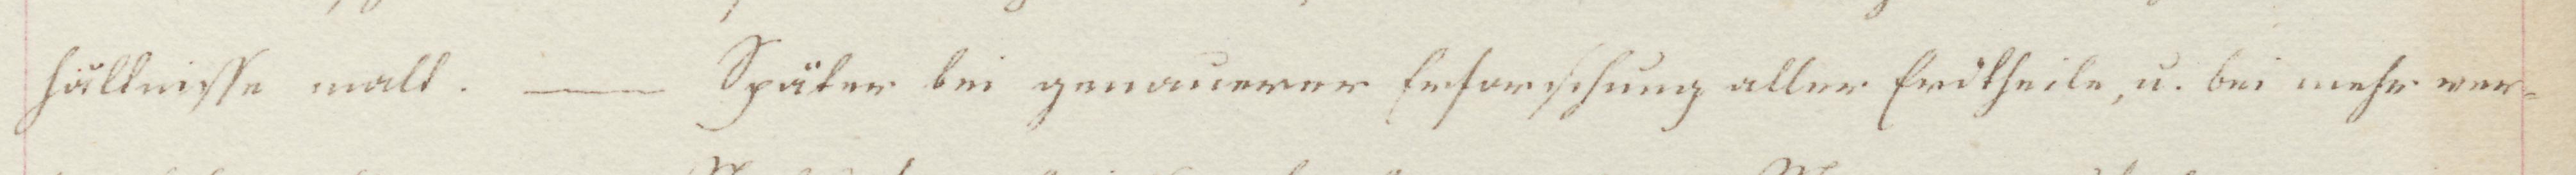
hältnisse malt. – Später bei genauerer Erforschung aller Erdtheile, u. bei mehr ver-
